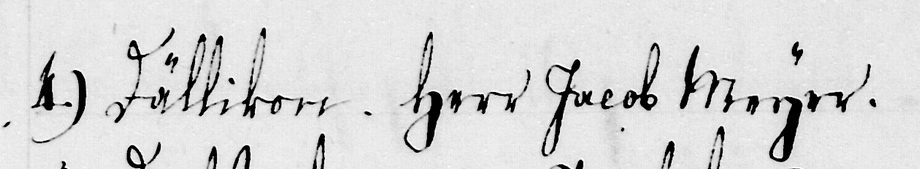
4.) Dällikon Herr Jacob Meyer.
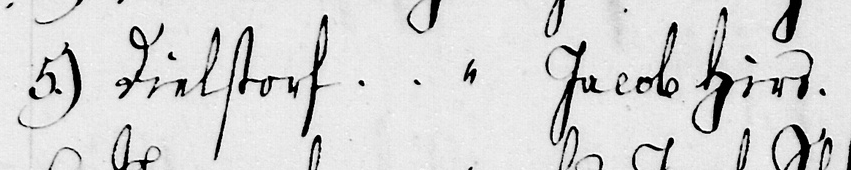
5.) Dielstorf “ Jacob Hirs.
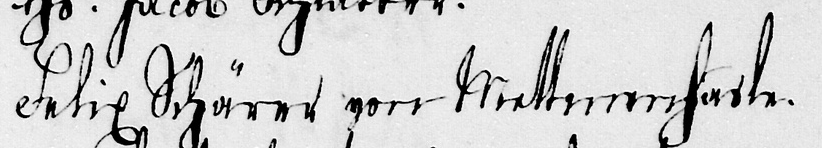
elix Schärer von Mettmenhasle.
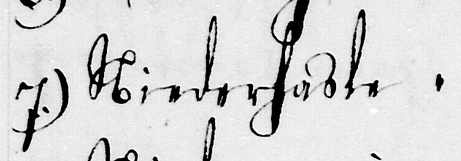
7.) Niederhasl¬
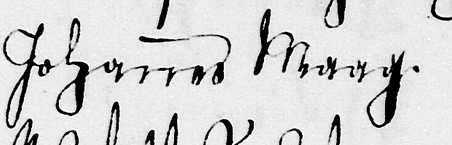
ohannes Maag.
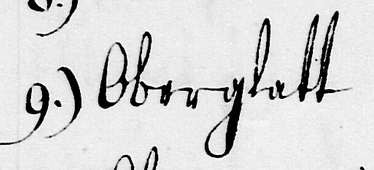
9.) Oberglat¬
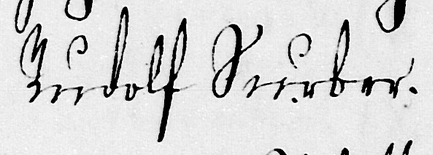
udolf Surber.
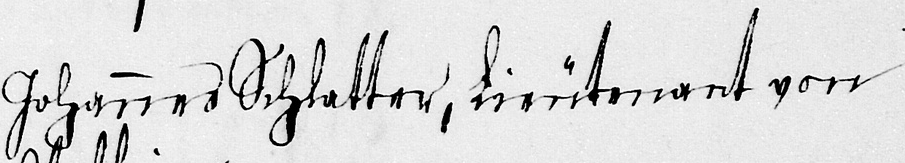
ohannes Schlatter, Lieutenant von
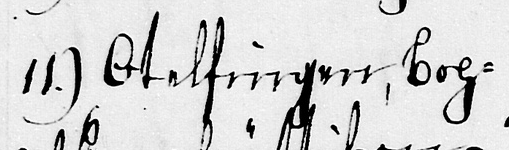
11.) Otelfingen, Bop¬
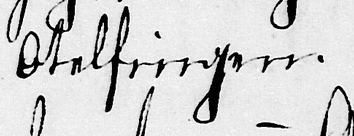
Otelfingen.
